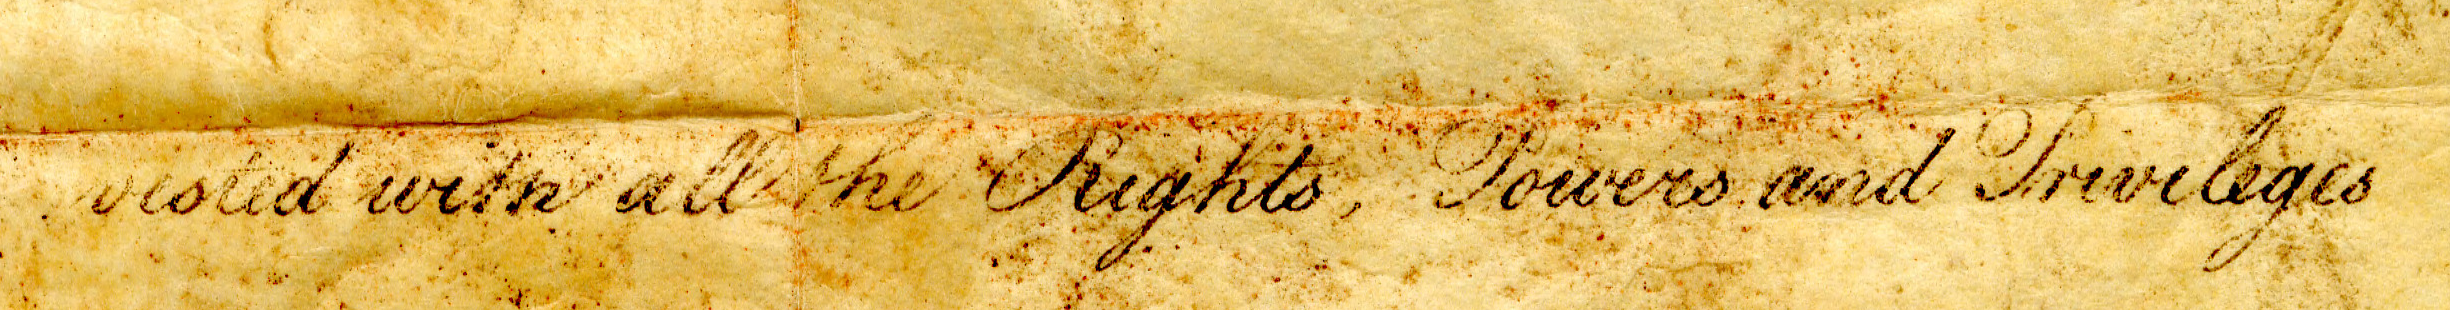vested with all the Rights, Powers and Privileges
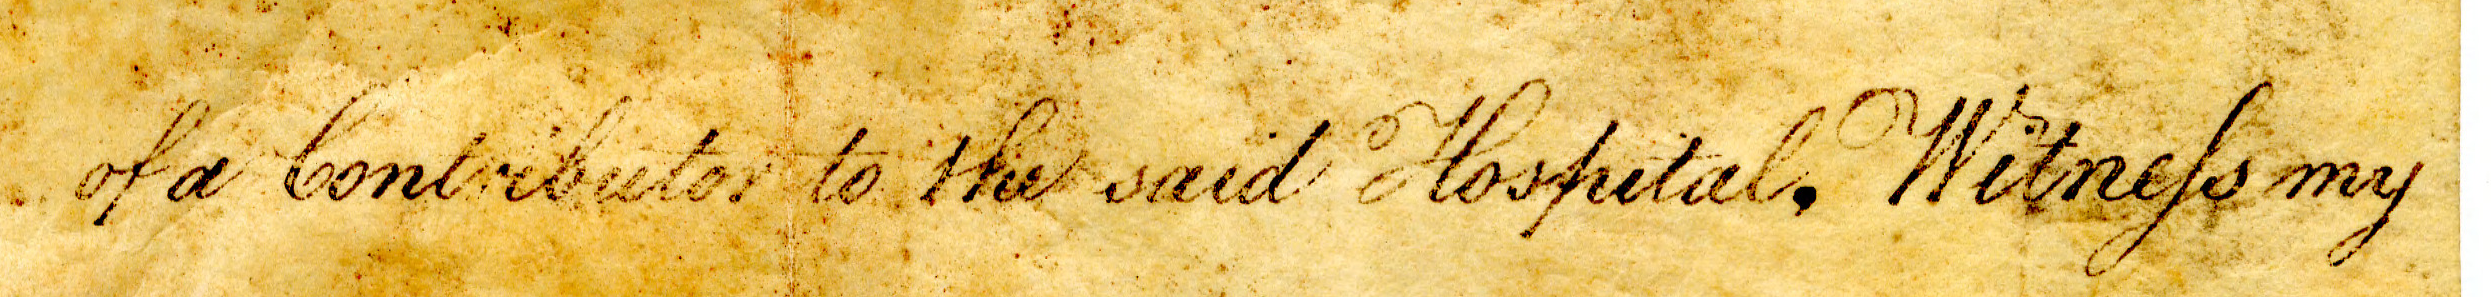of a Contributor to the said Hospital. Witness my
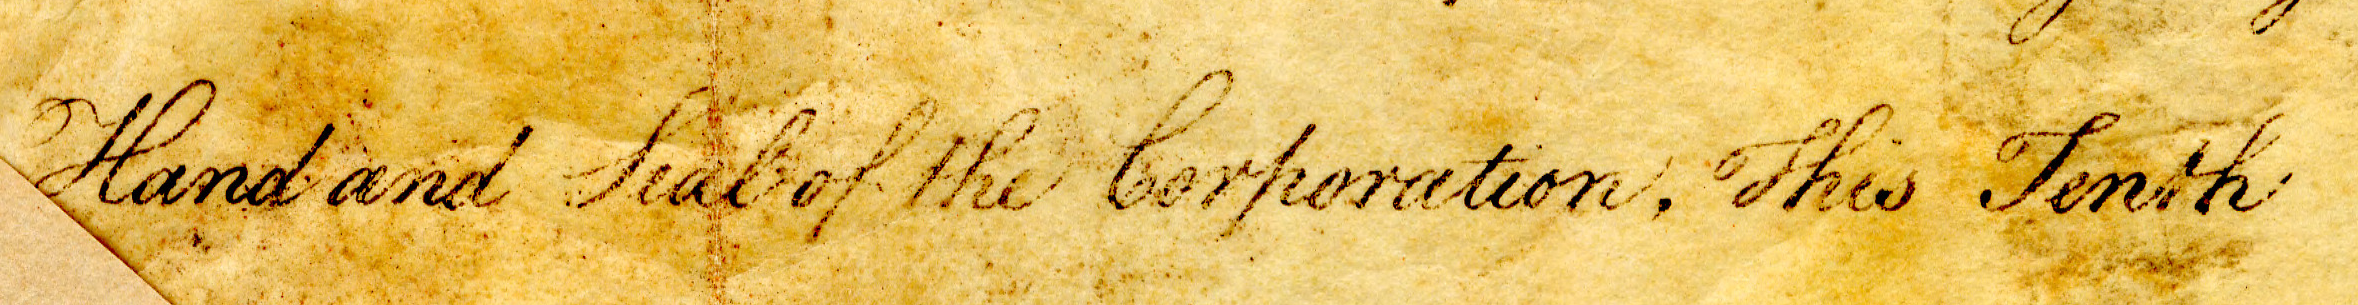Hand and Seal of the Corporation. This Tenth
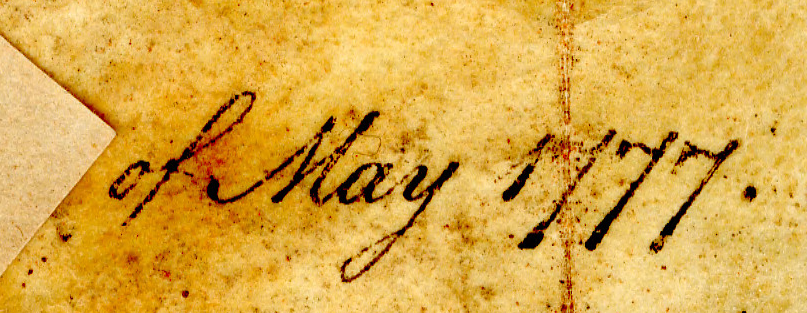of May 1777.
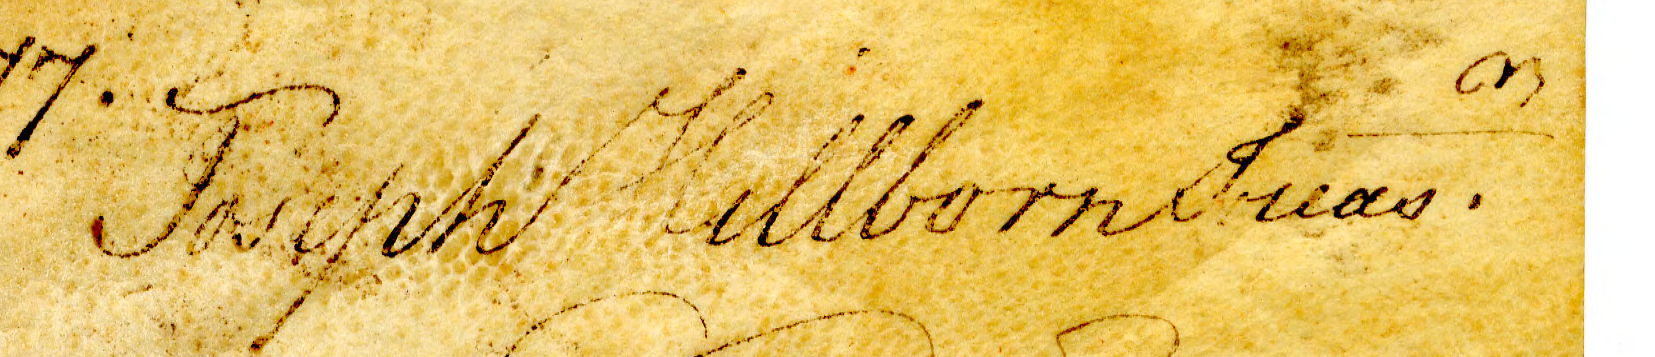Joseph Hillborn Treas^r.
